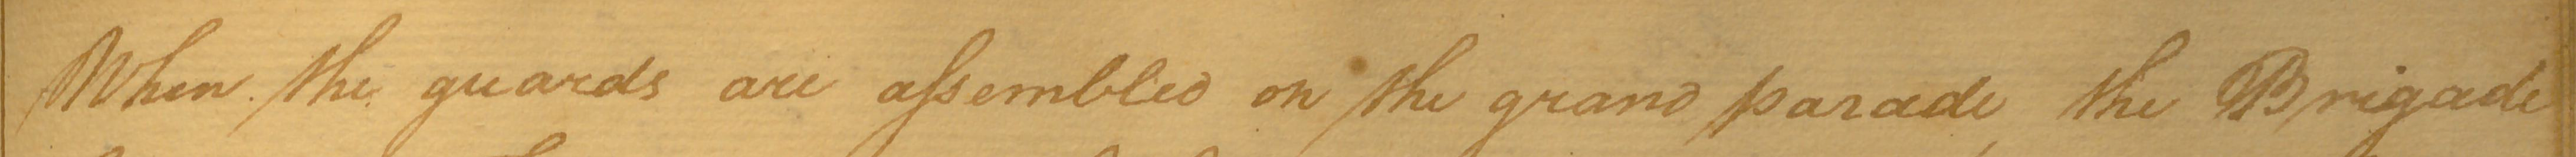When the guards are assembled on the grand parade the Brigade
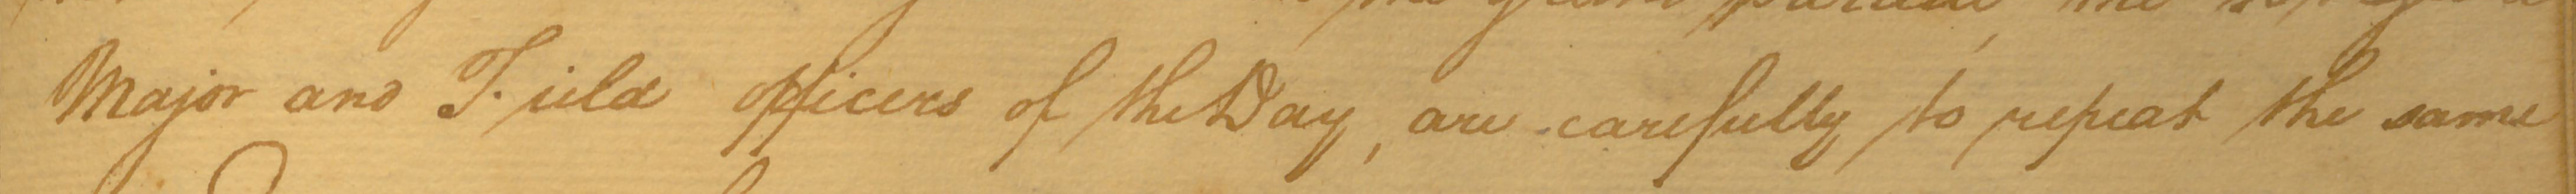Major and Field officers of the Day, are carefully to repeat the same
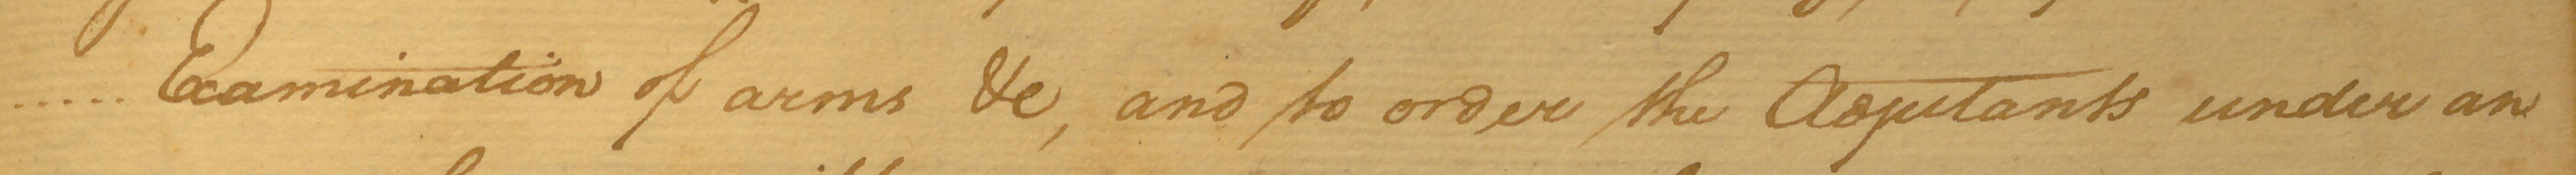....Examinations of arms &c, and to order the Adjutants under an
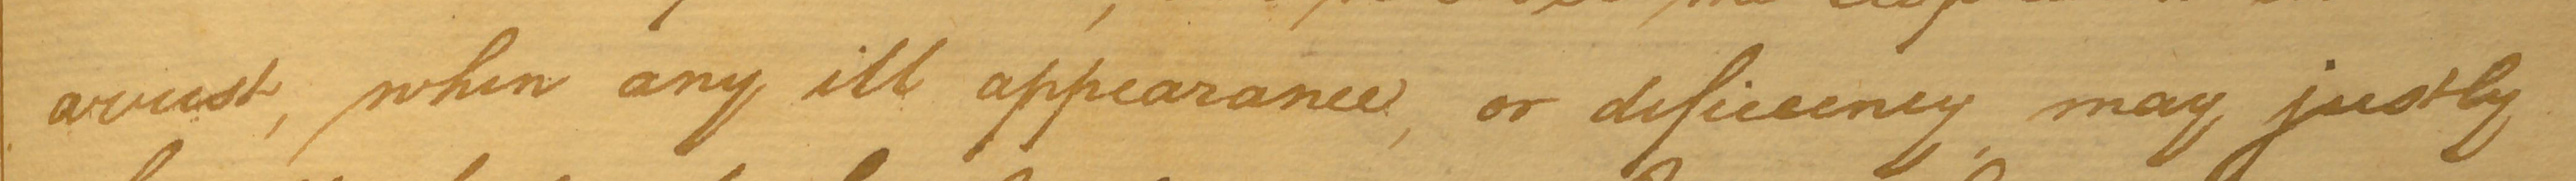arrest, when any ill appearance or deficiency may justly
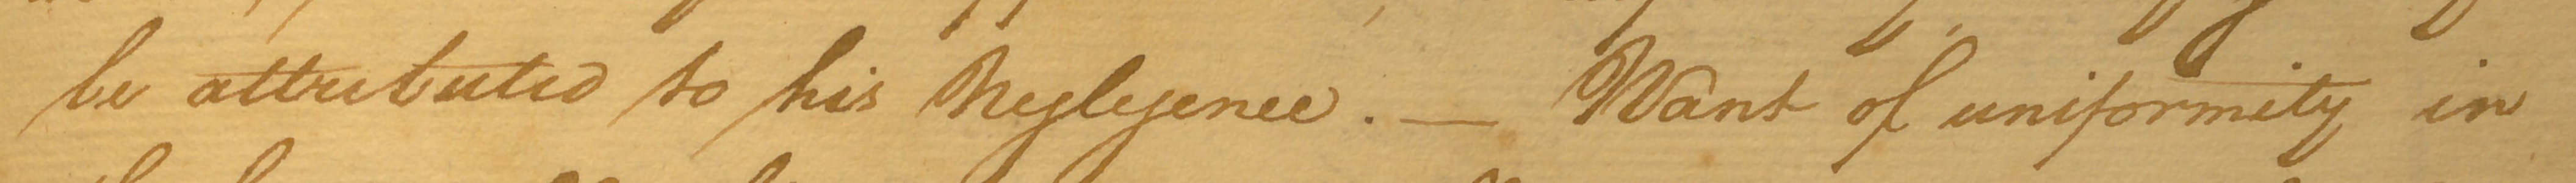be attributed to his negligence.- Want of uniformity in
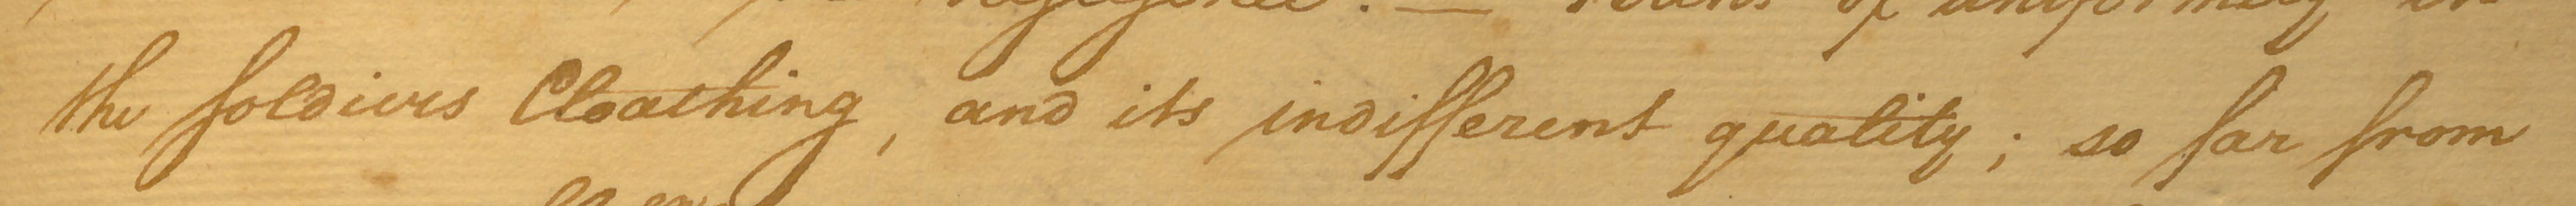the soldiers Cloathing, and its indifferent quality; so far from
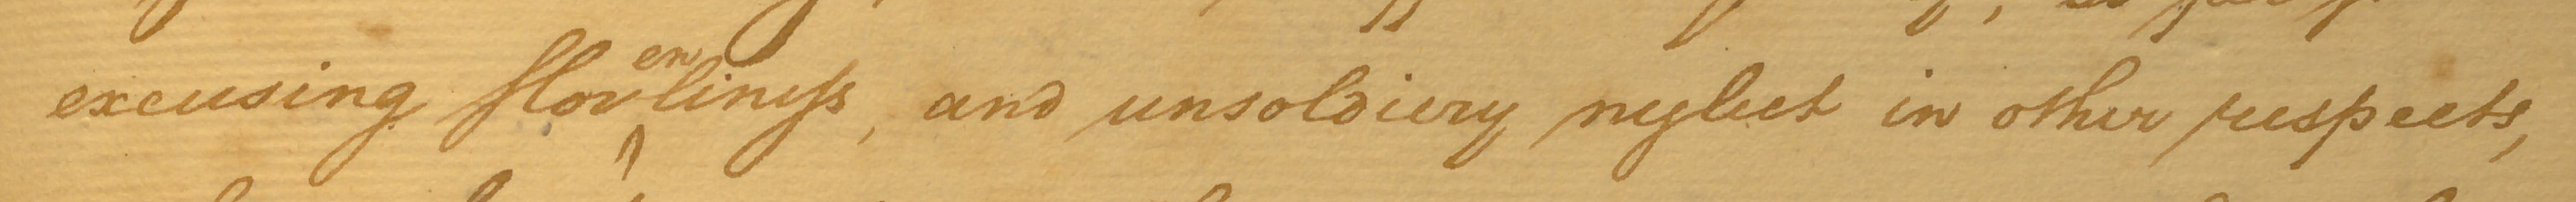excusing slov^enliness, and unsoldiery neglect in other respects,
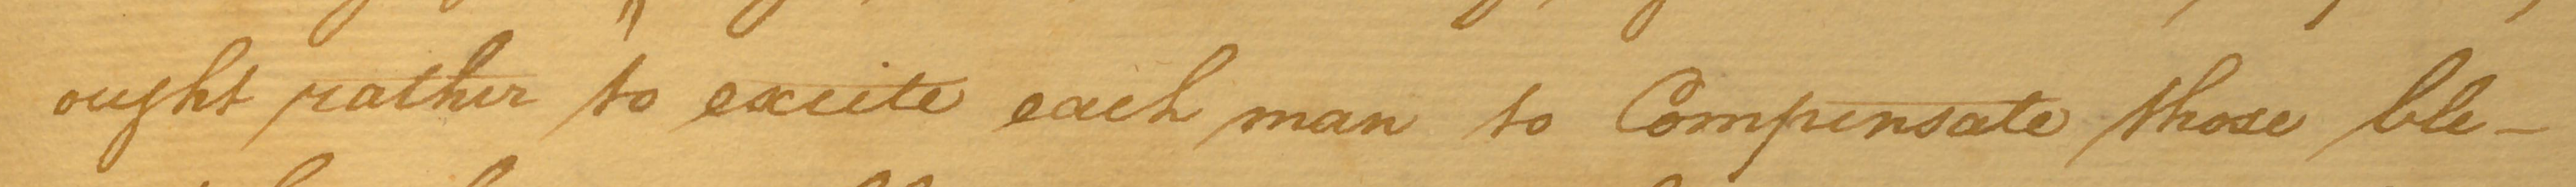ought rather to excite each man to Compensate those ble-
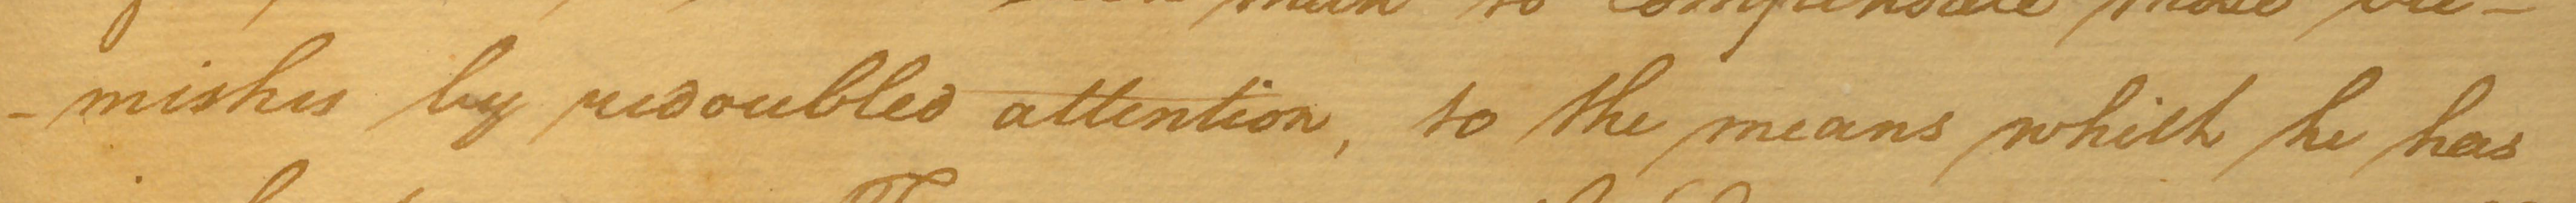-mishes by redoubled attention, to the means which he has
